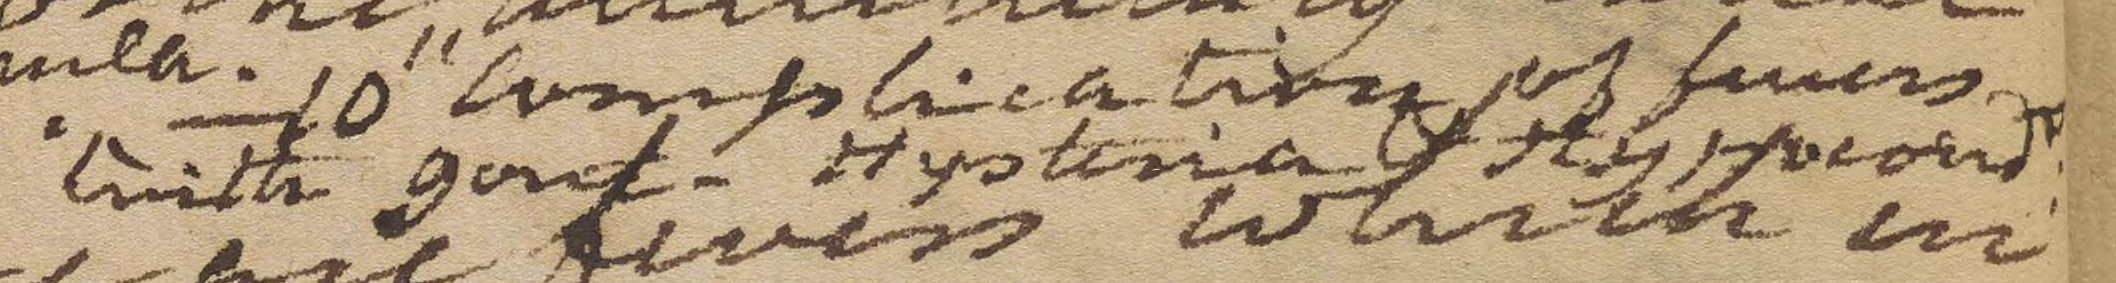with gout, hysteria, & hypocond^
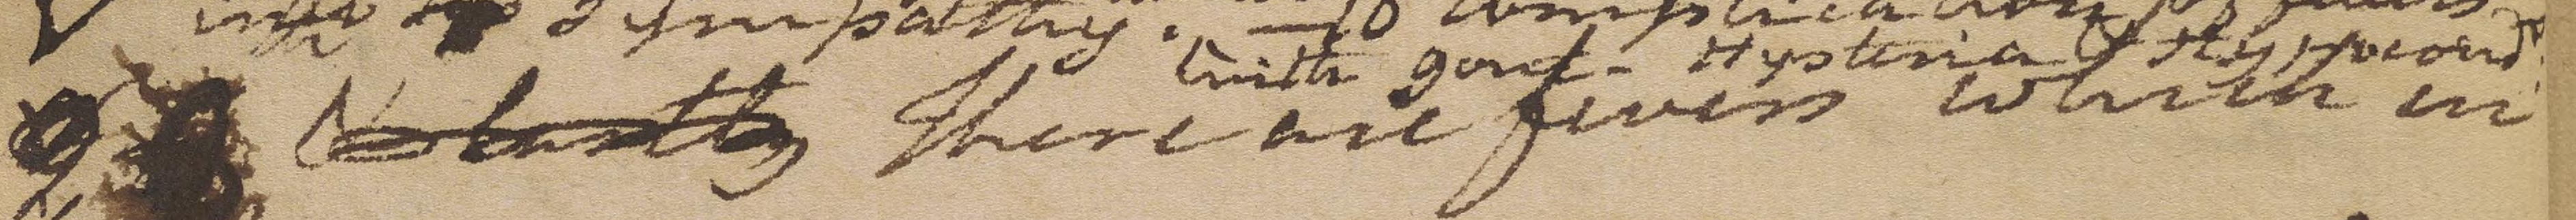There are fevers which in
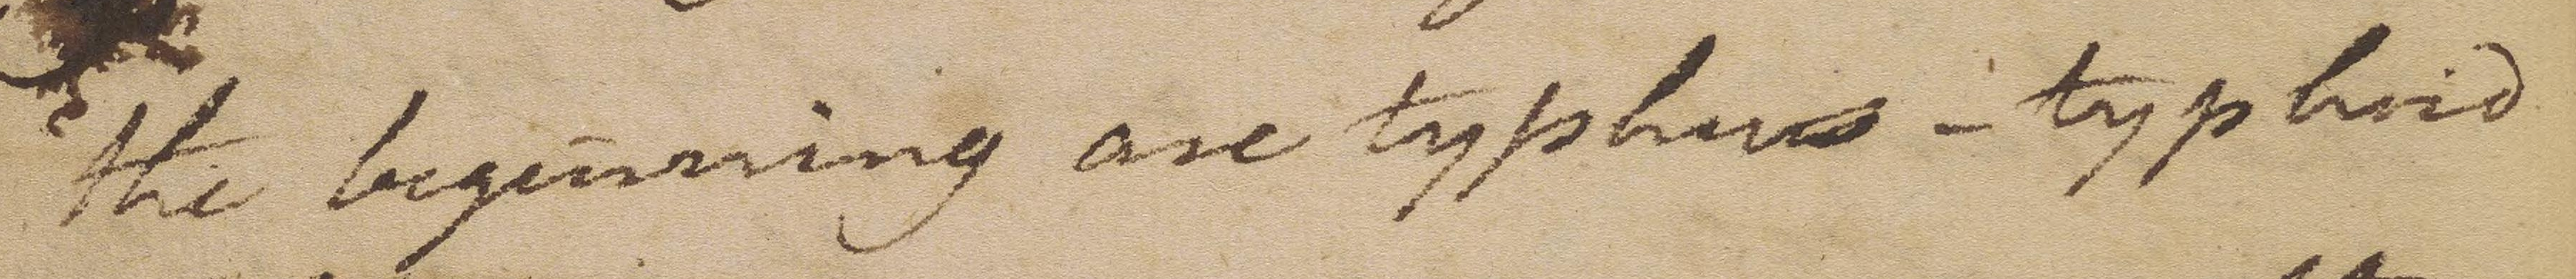the beginning are typhus, typhoid
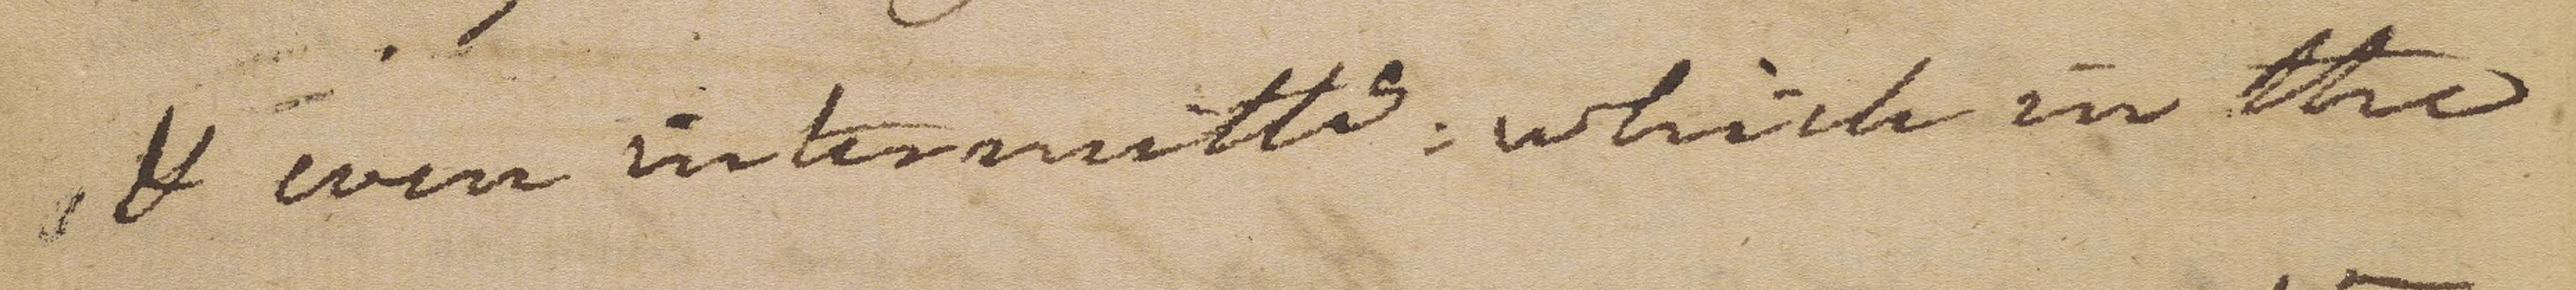& even intermitt^g which in the
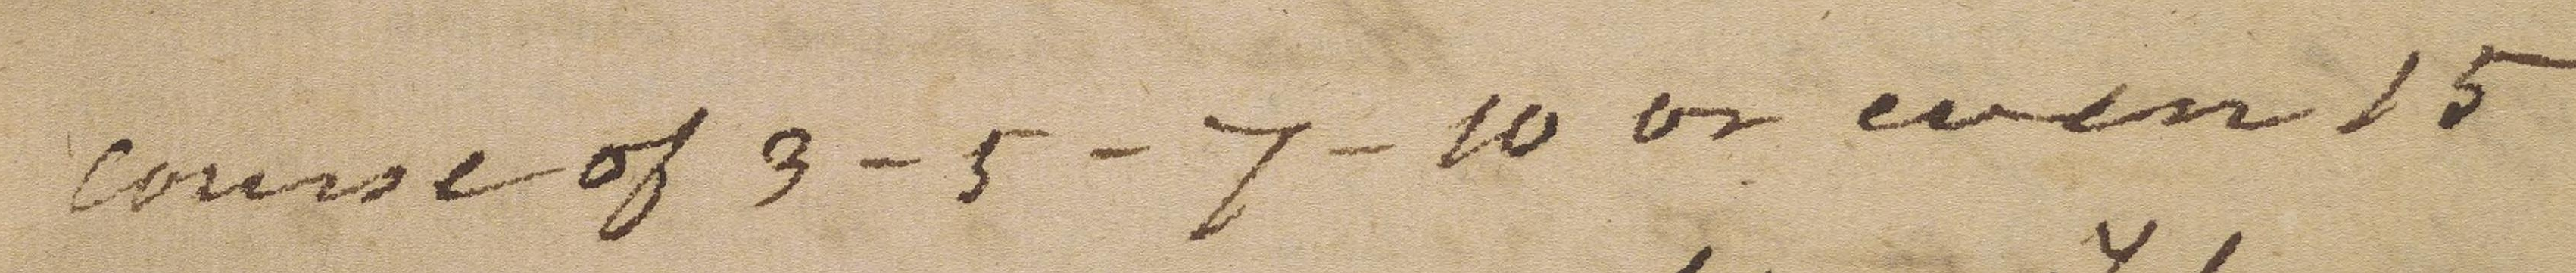course of 3-5-7-10 or even 15
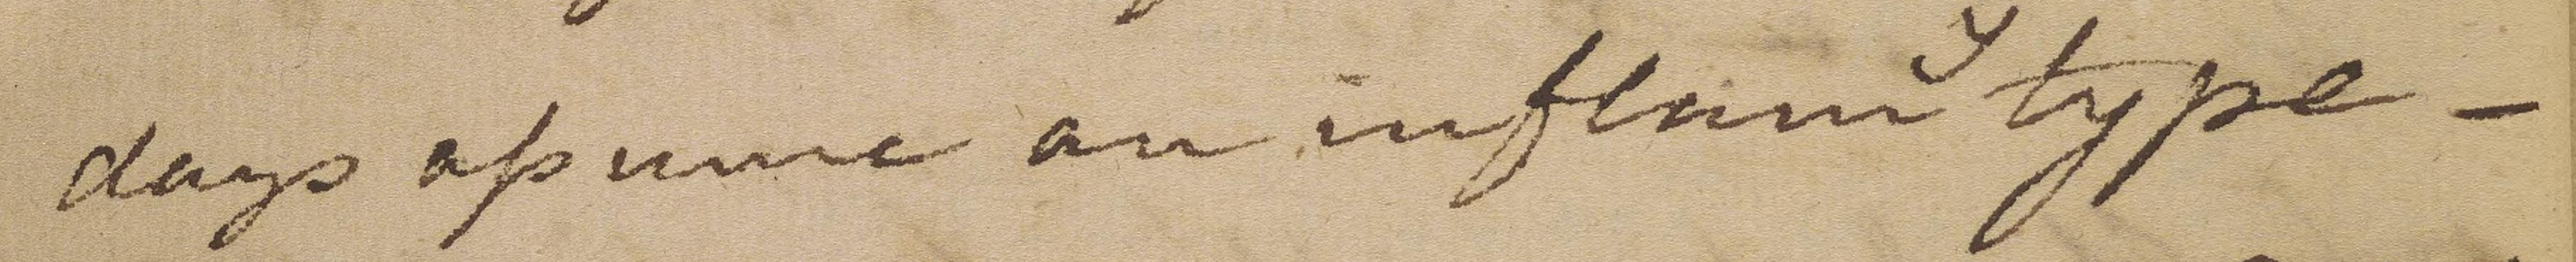days assure an inflam^y type.
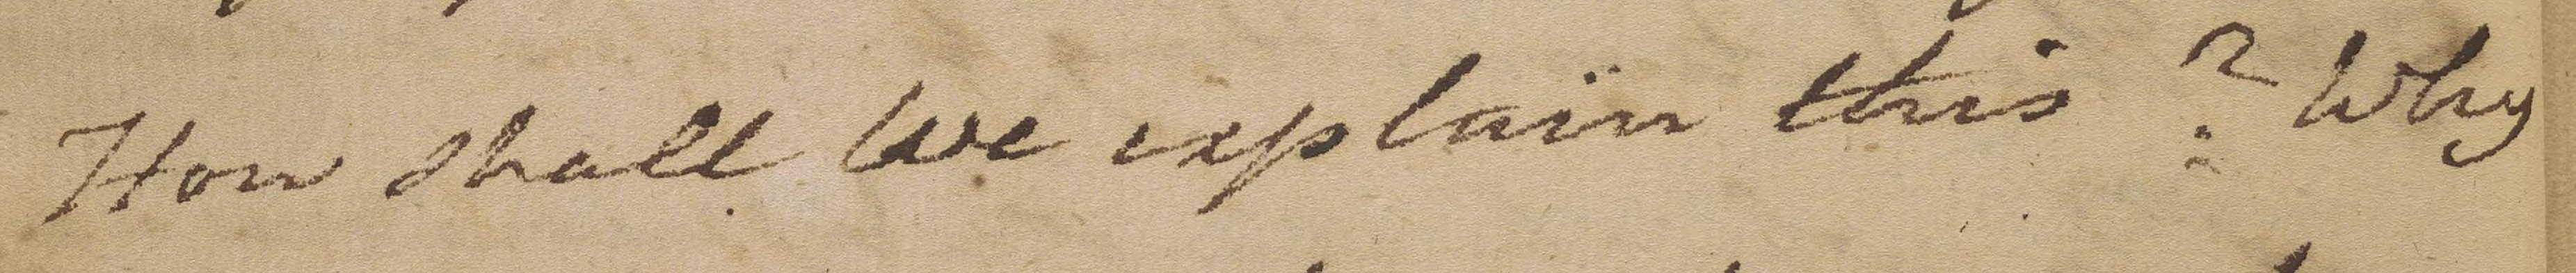How shall we explain this? Why
